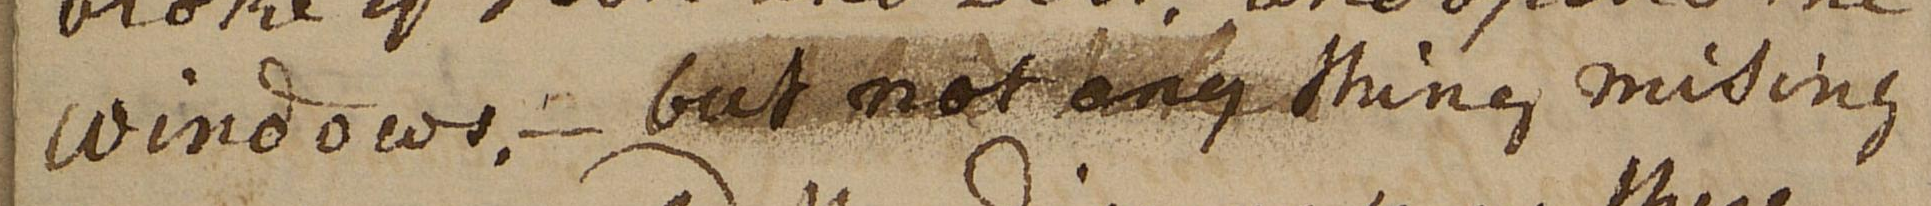Windows- but not any thing mising
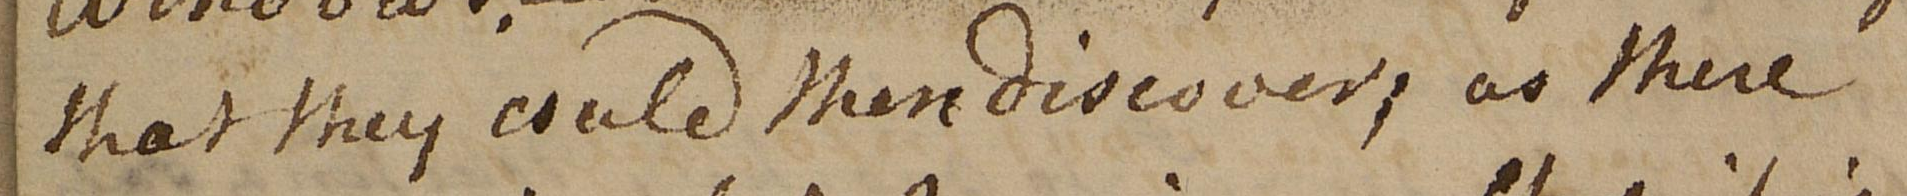that they could then discover, as there
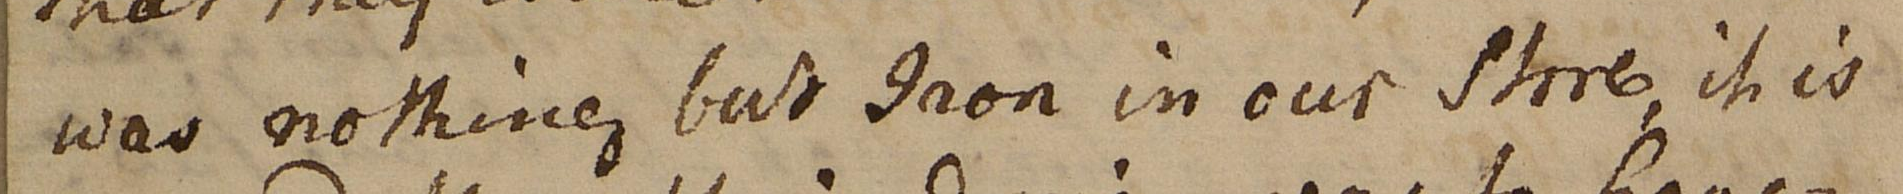was nothing, but Iron in our Store, it is
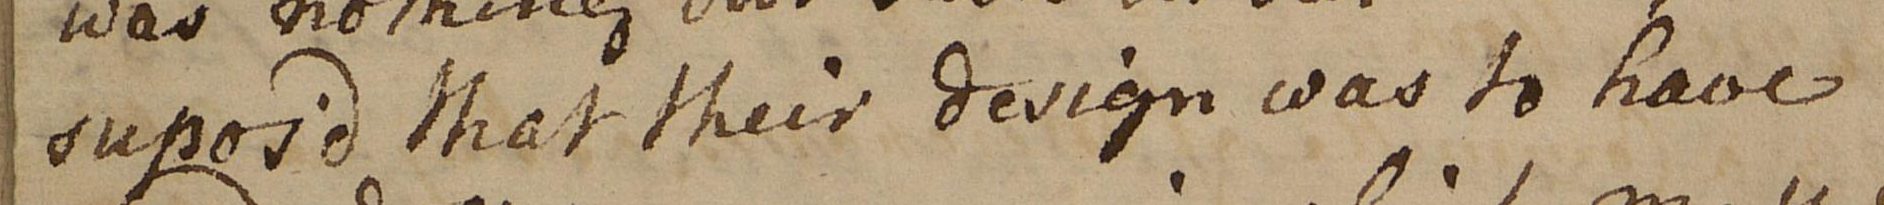supos'd that their design was to have
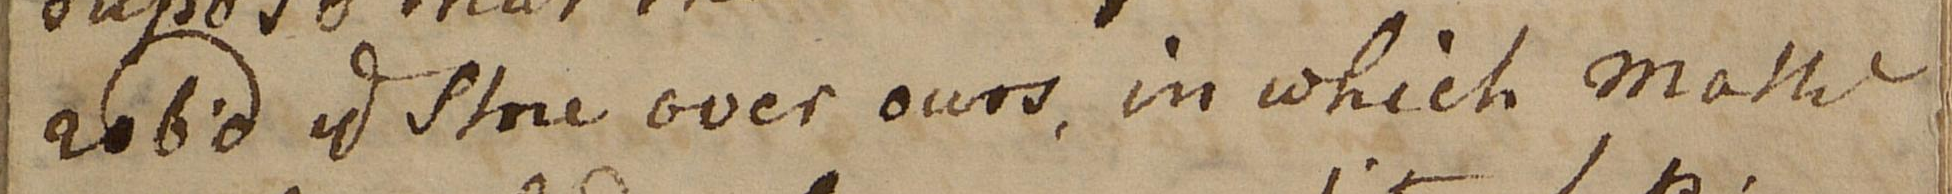rob'd y^e Store over ours, in which Math^e
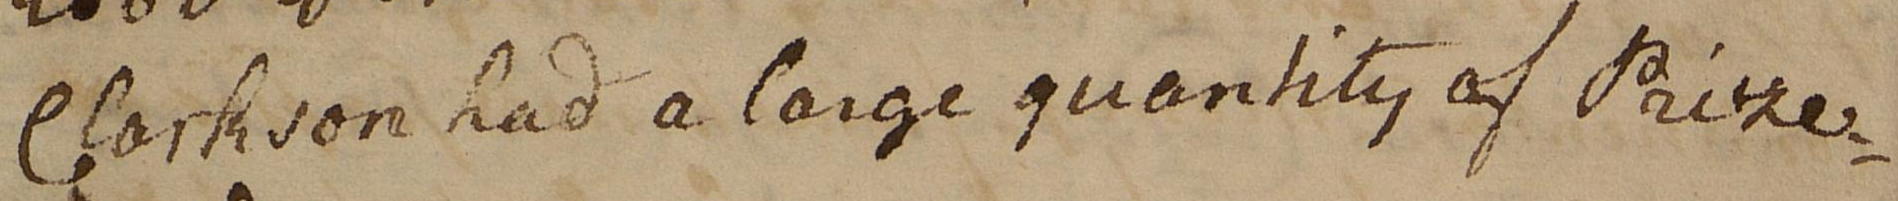Clarkson had a large quantity of Prize-
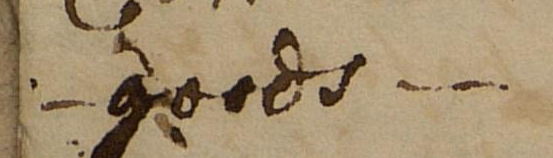-goods--
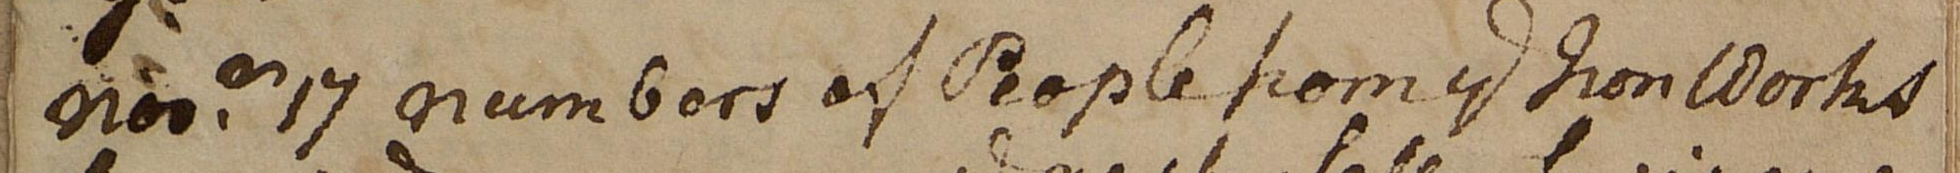Nov^r. 17 numbers of People from y^e Iron Works
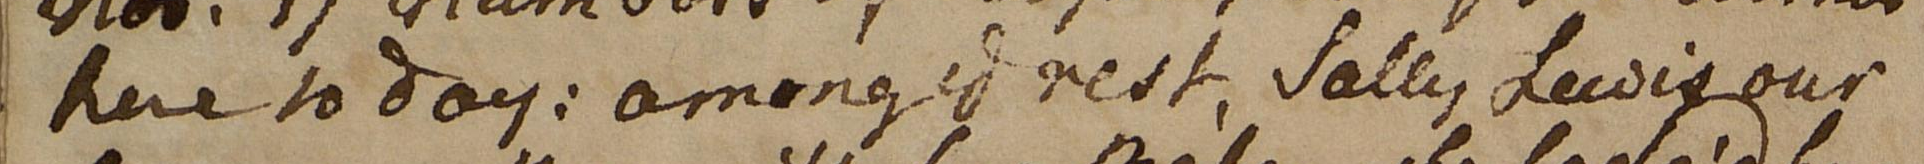here to day: among y^e rest, Sally Lewis our
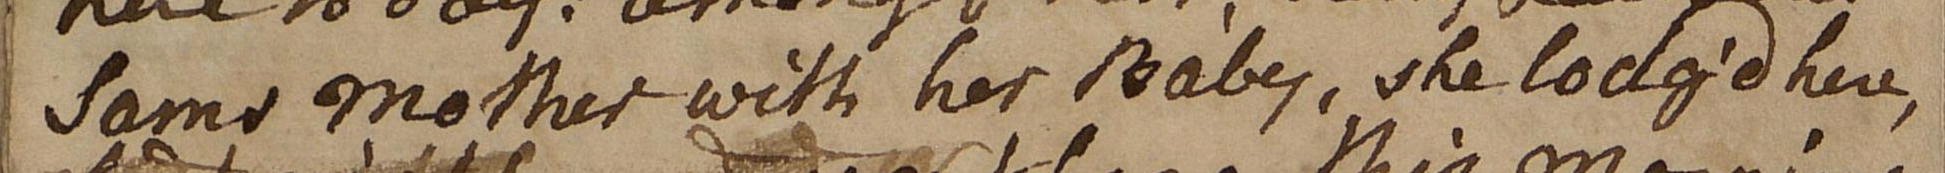Sams Mother with her Baby, she lodg'd here,
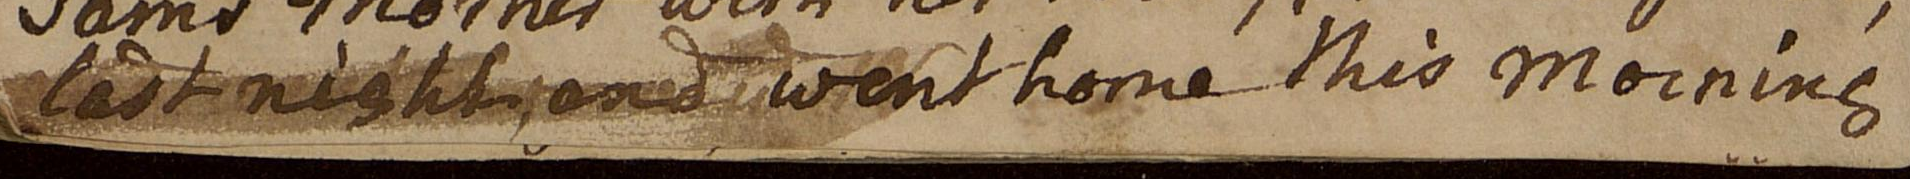last night and went home this morning
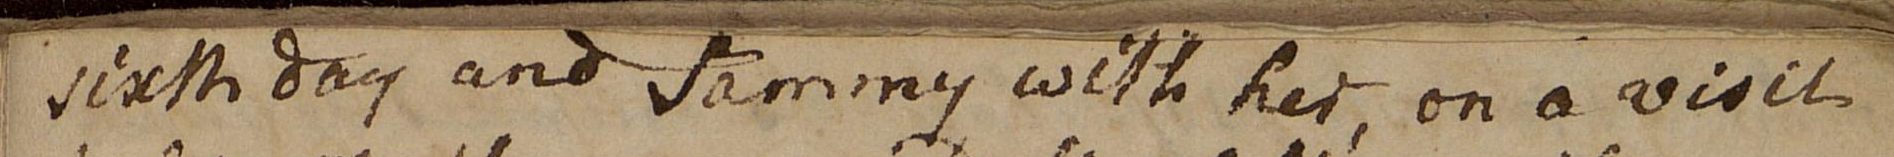sixth day and Sammy with her, on a visit
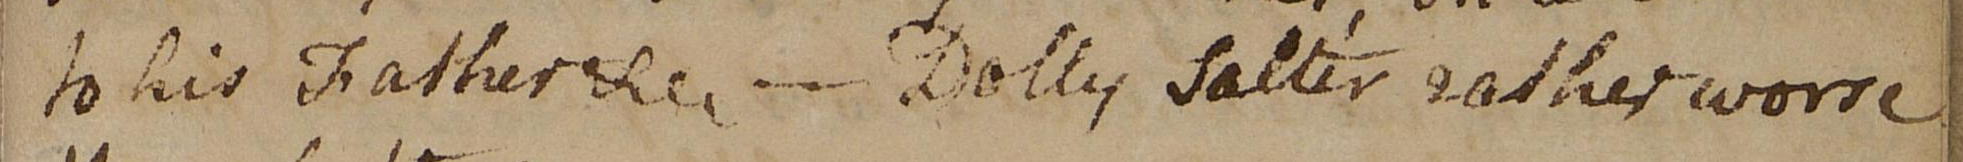to his Father &c- Dolly Salter rather worse
